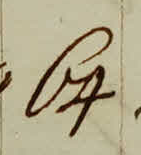64
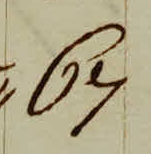67
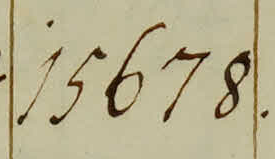15678
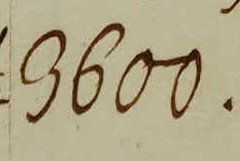3600
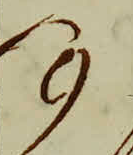9
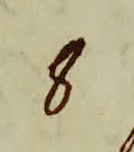8
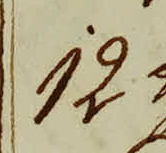12
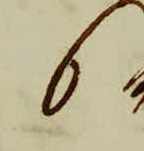6
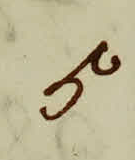5
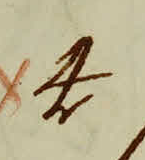4
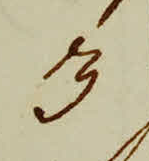3
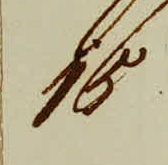15
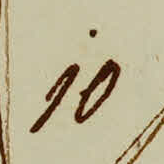10
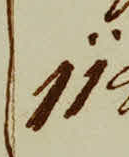11
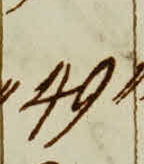49
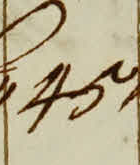45
